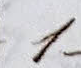1
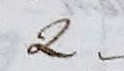2
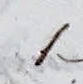1
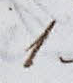1
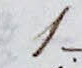1
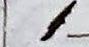1
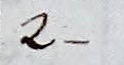2
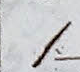1
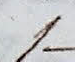1
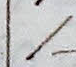1
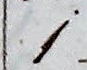1
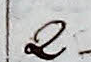2
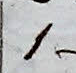1
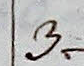3
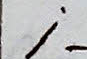1
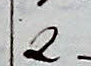2
